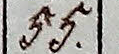55.
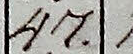47.
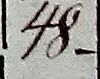48
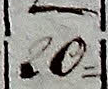20
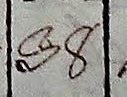38
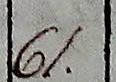61.
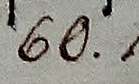60.
